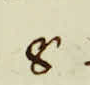8
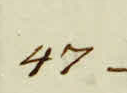47
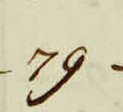79
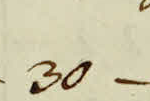30
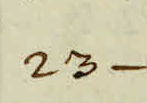23
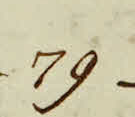79
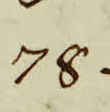78
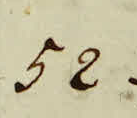52
